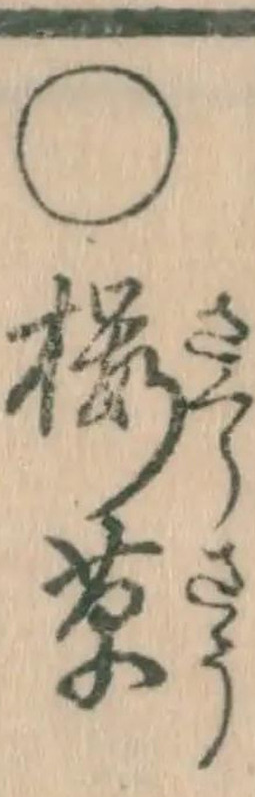〇桜草
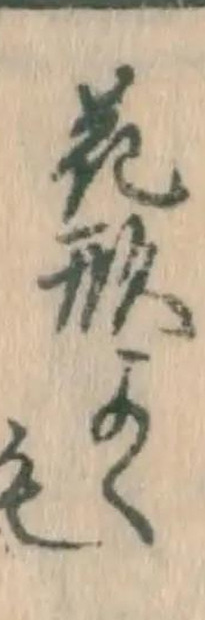花形よく
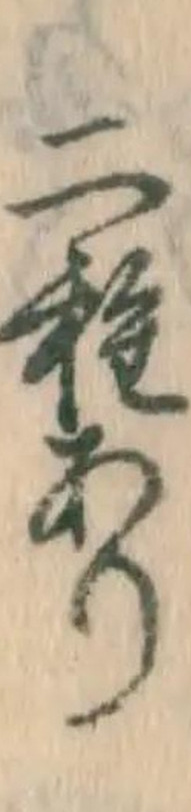二種あり
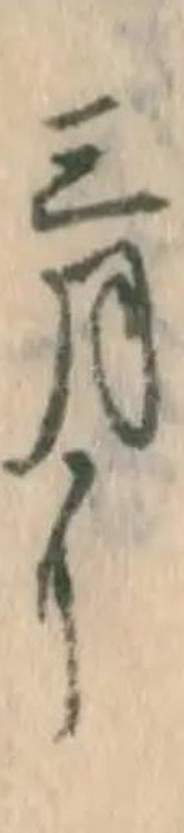三月に

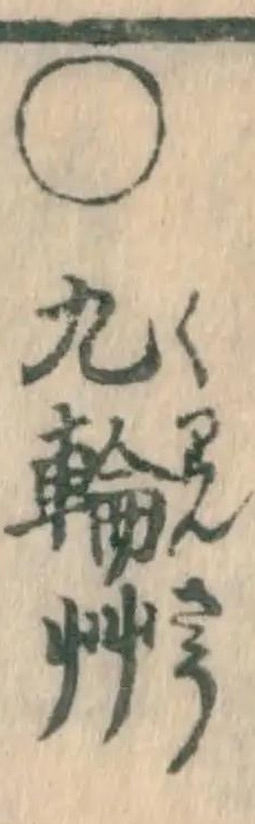〇九輪艸
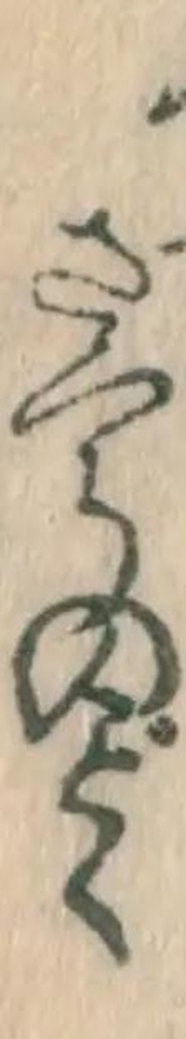さくらのごとく
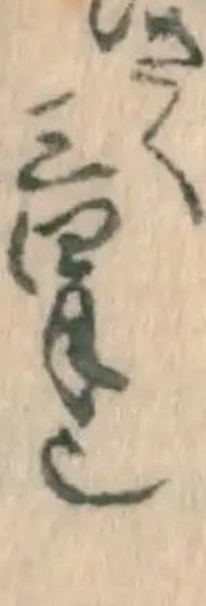三四月也
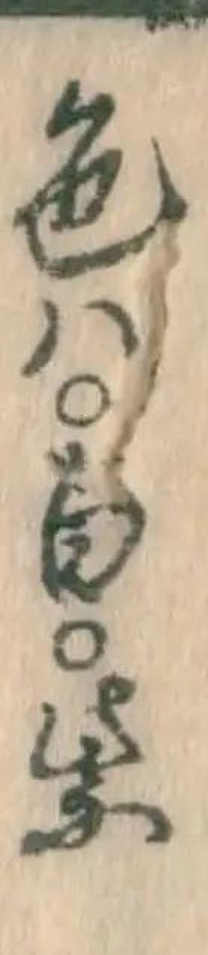色は〇白〇紫
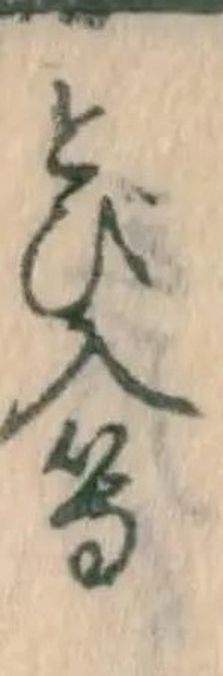とび入等
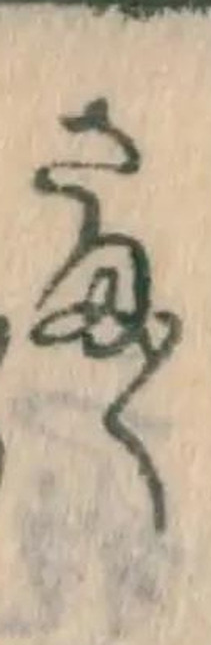さま〳〵
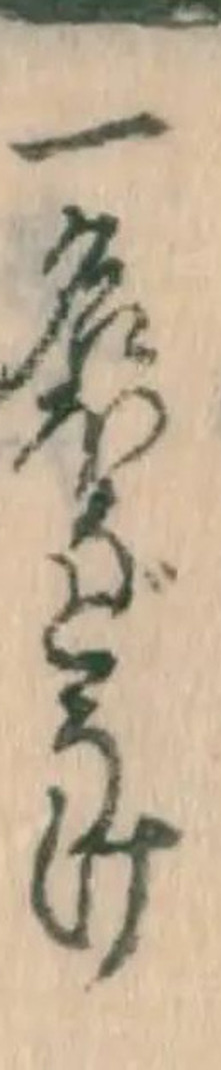一名ほうどうけ
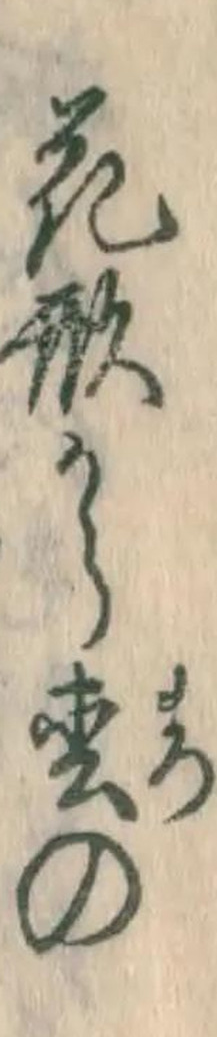花形から松の
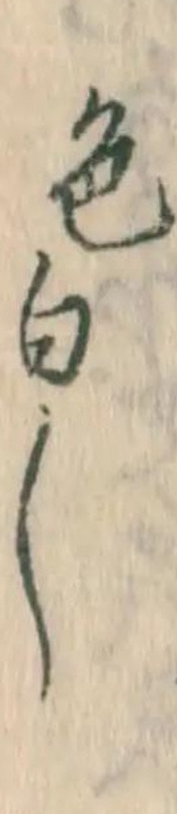色白く
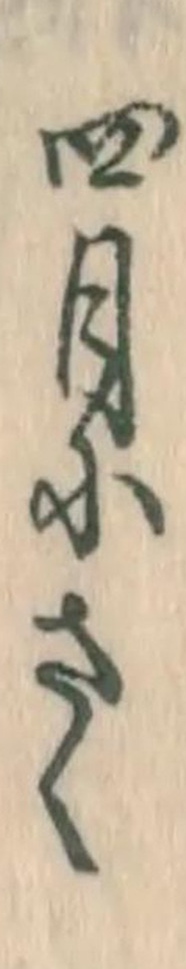四月にさく

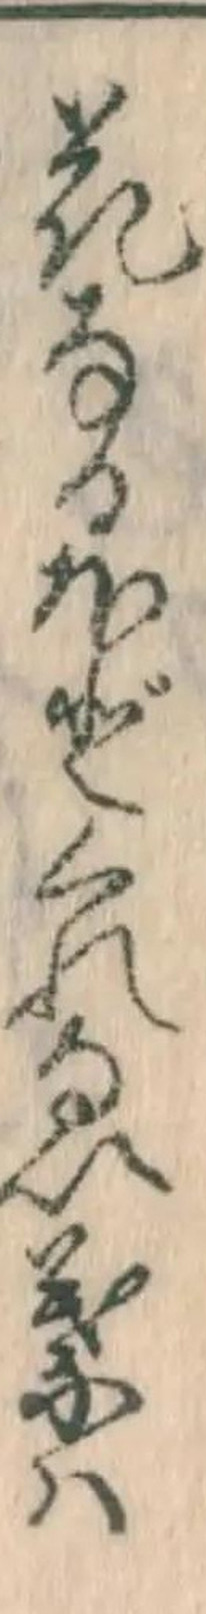花なるほどくれない葉は
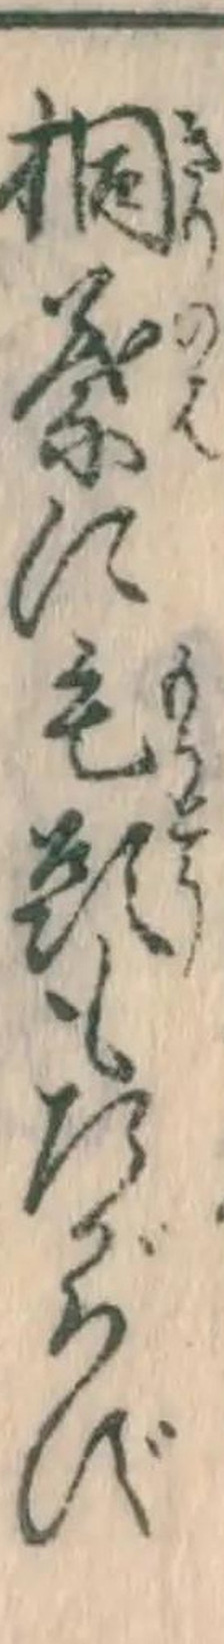桐葉に毛頭もたがはず
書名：艸花繪前集. [2]
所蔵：国立国会図書館 National Diet Library, JAPAN
